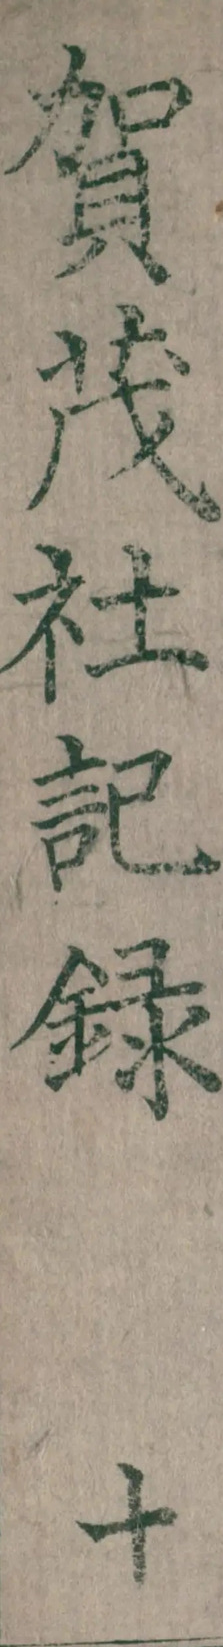賀茂社記録十

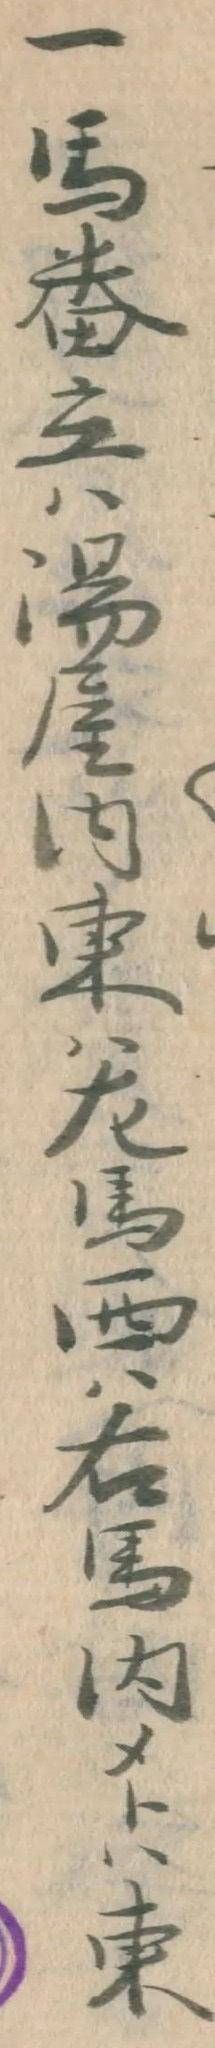一馬番立ハ湯屋内東ハ左馬西ハ右馬内メトハ東
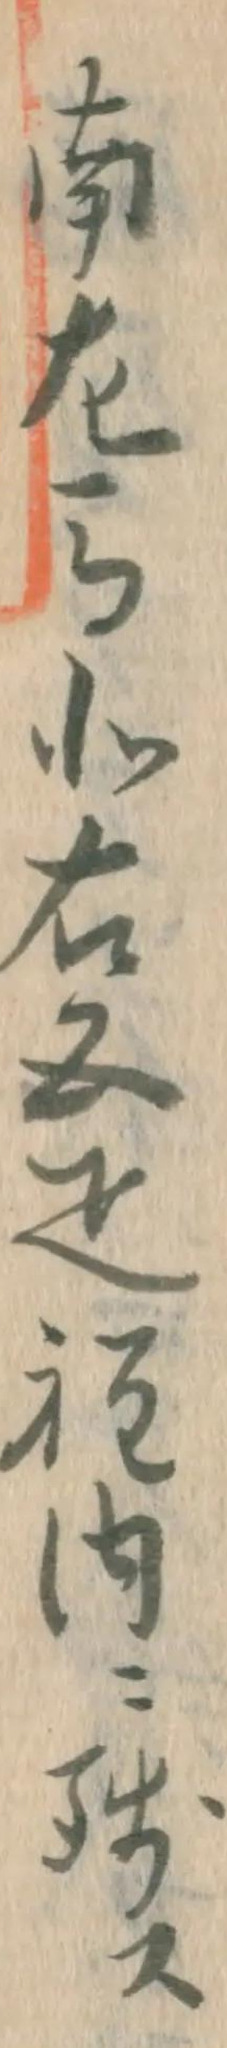南左馬北右五疋程内ニ残ス
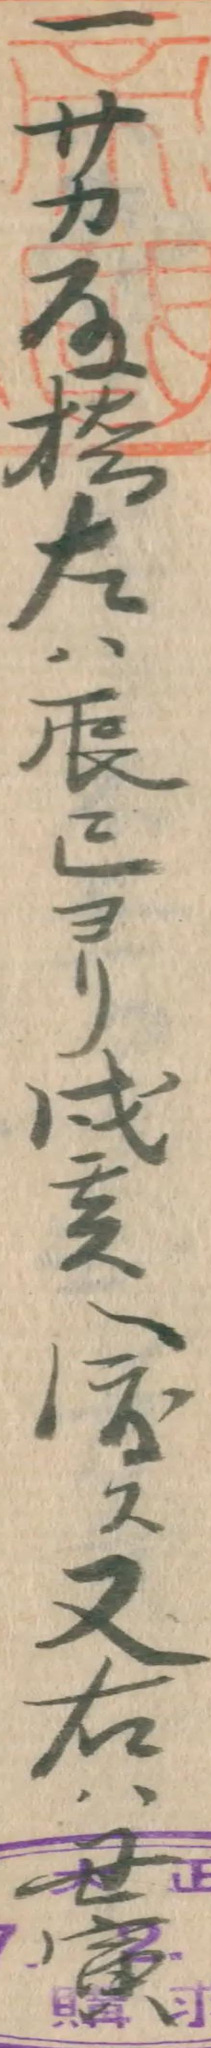一サカ殿橋左ハ辰巳ヨリ戌亥へ渡ス又右ハ丑寅
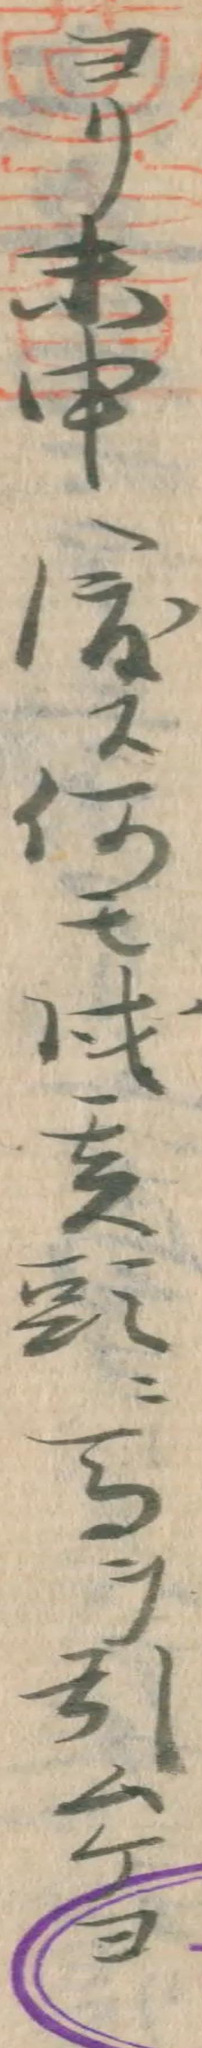ヨリ未申ヘ渡ス何モ戌亥頭ニ馬ヲ引ムケヨ
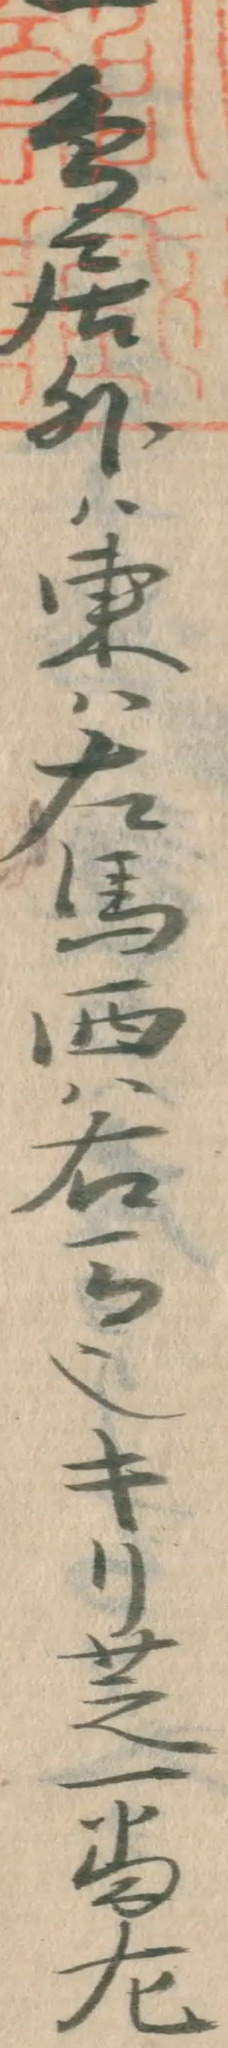一鳥居外ハ東ハ左馬西ハ右馬也キリ芝一番左
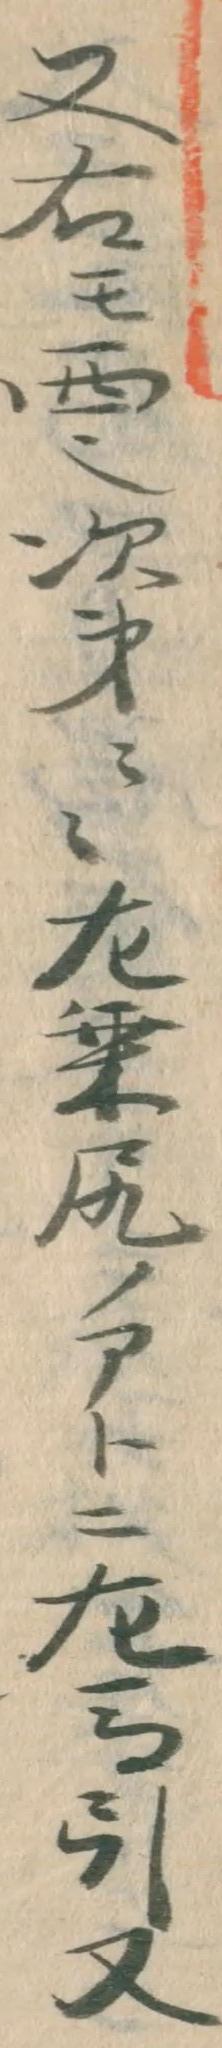又右モ西也次第々々左乗尻ノアトニ左馬引又
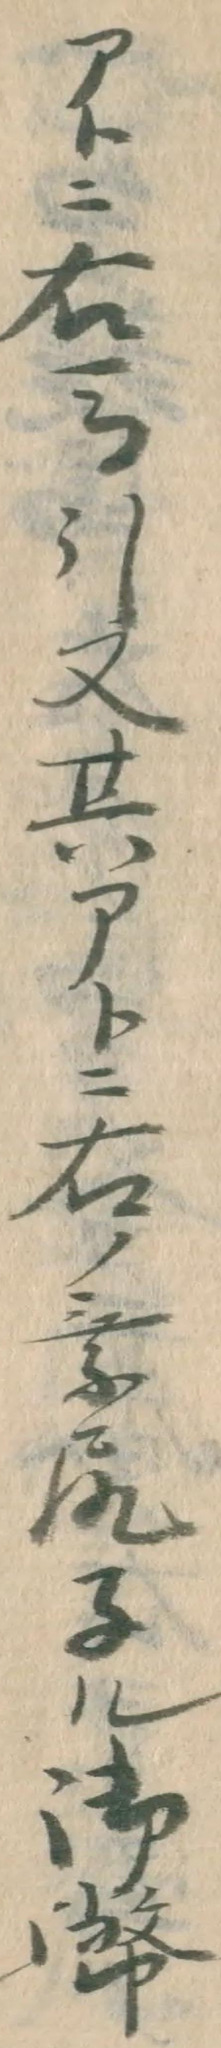アトニ右馬引又其アトニ右ノ乗尻子ル御幣
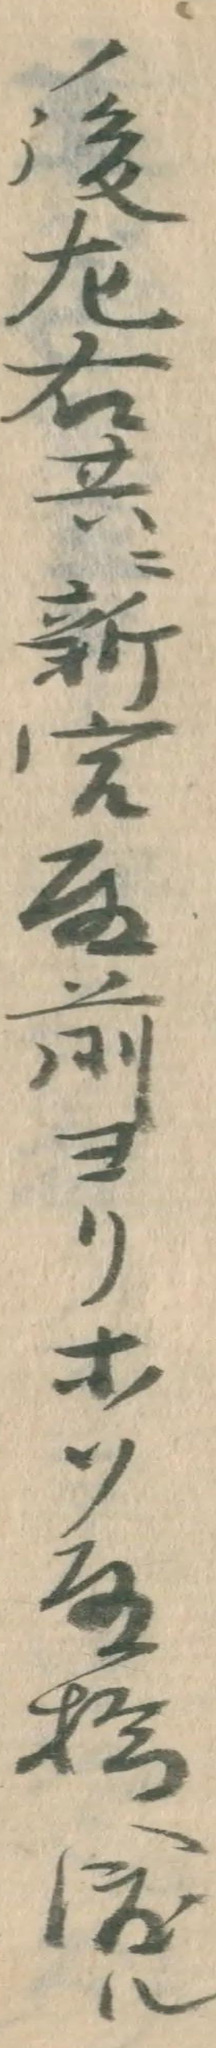ノ後左右共ニ新宮殿前ヨリホソ殿橋へ渡ル
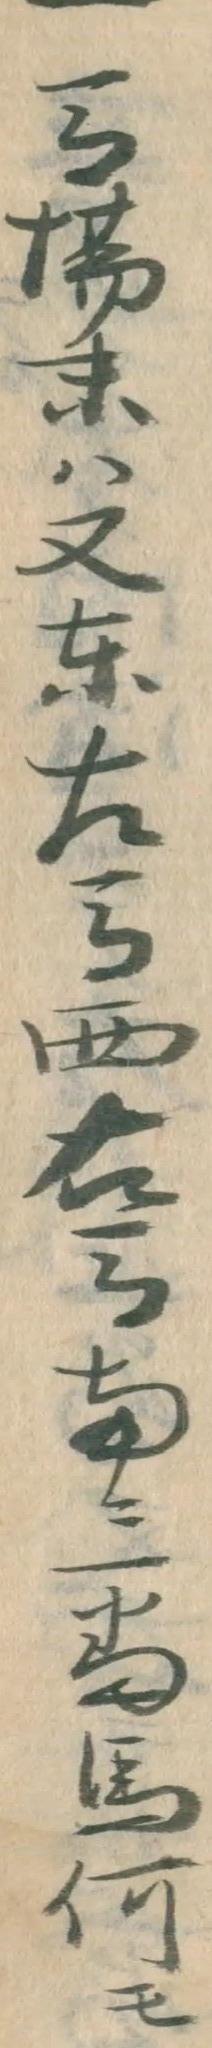一馬場末ハ又東左馬西右馬南ニ一番馬何モ

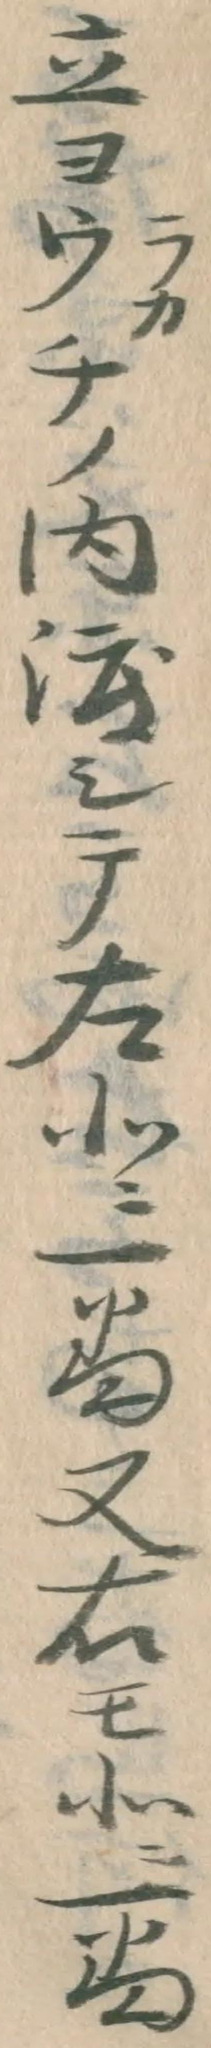立ヨウチノ内渡シテ左北ニ一番又右モ北ニ一番
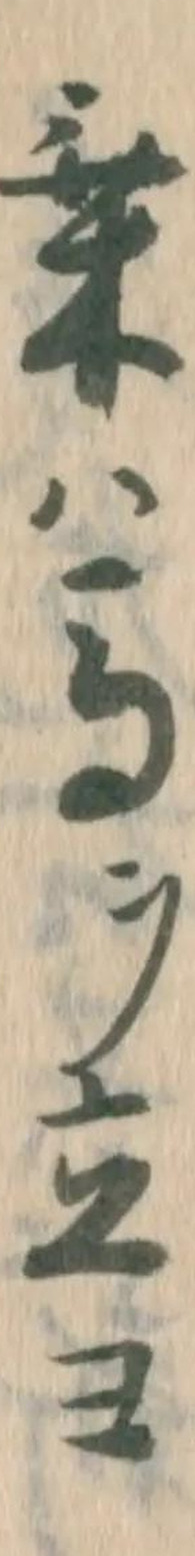乗ハ馬ヲ立ヨ
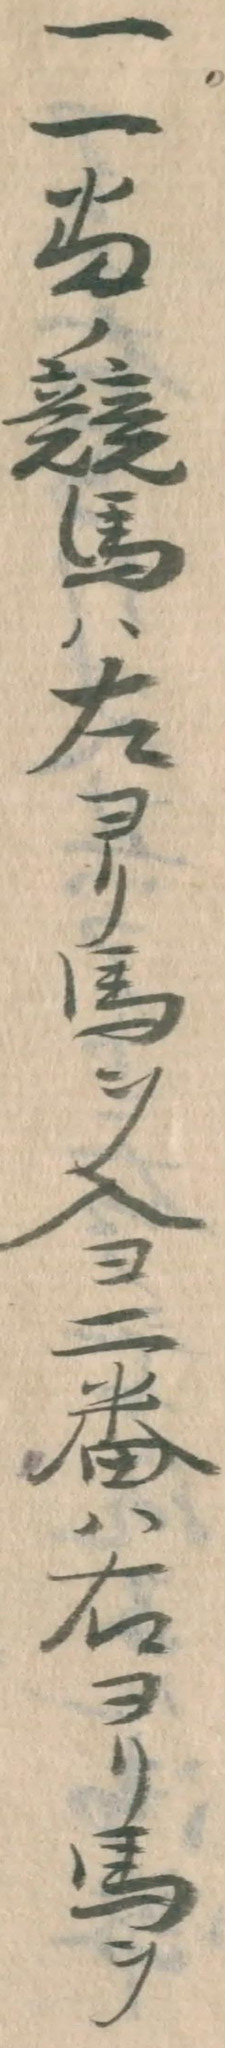一一番ノ競馬ハ左ヨリ馬ヲ入ヨ二番ハ右ヨリ馬ヲ
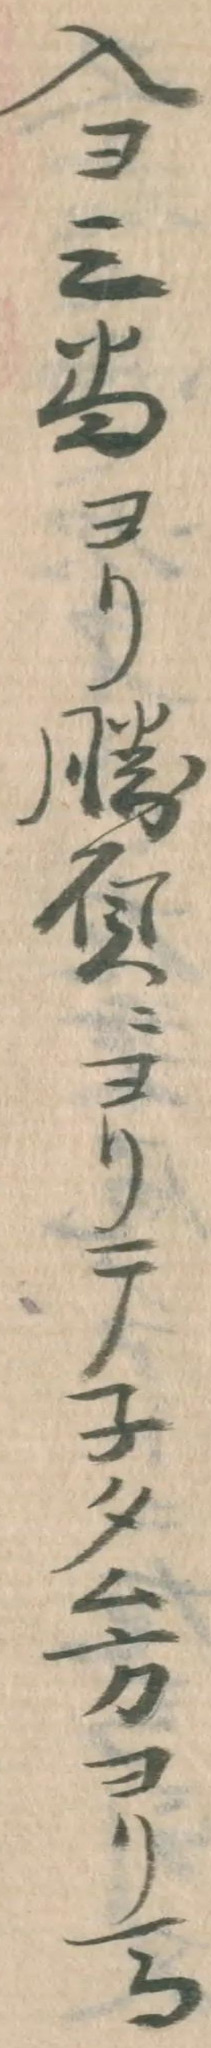入ヨ三番ヨリ勝負ニヨリテ子タム方ヨリ馬
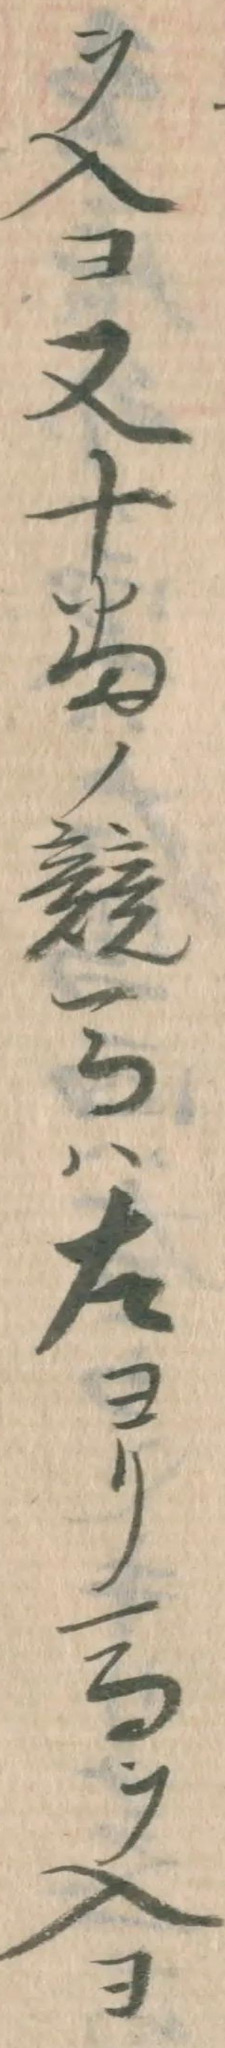ヲ入ヨ又十番ノ競馬ハ左ヨリ馬ヲ入ヨ
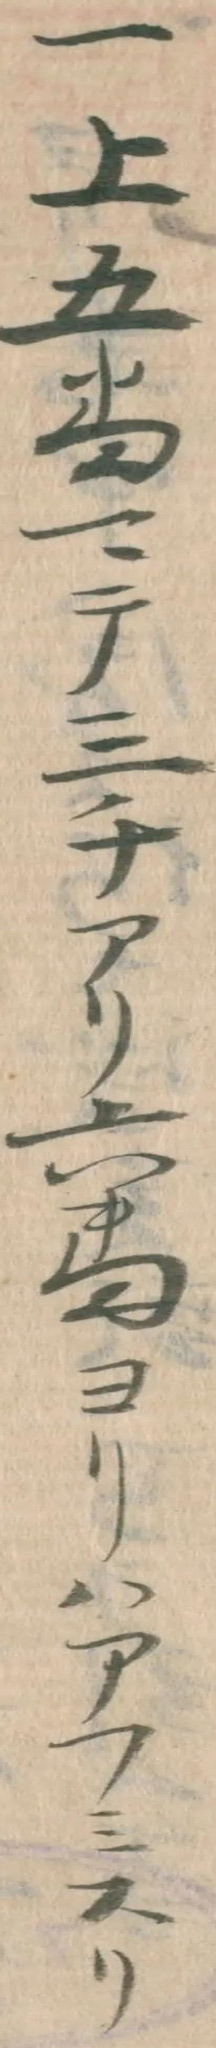一上五番マテ三千アリ六番ヨリハアフミスリ
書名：賀茂社記録. 第10冊
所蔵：国立国会図書館 National Diet Library, JAPAN
